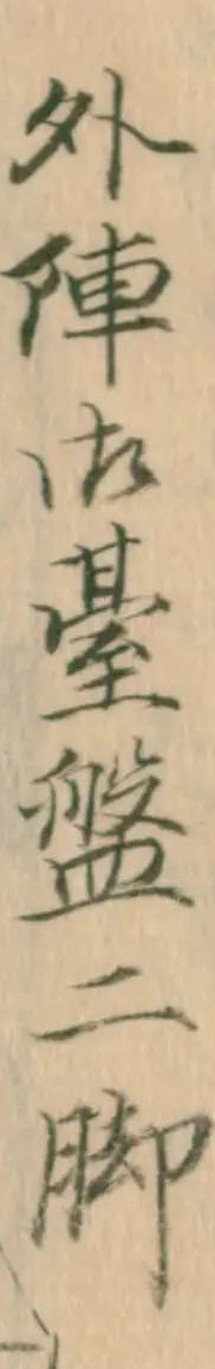外陣御台盤二脚
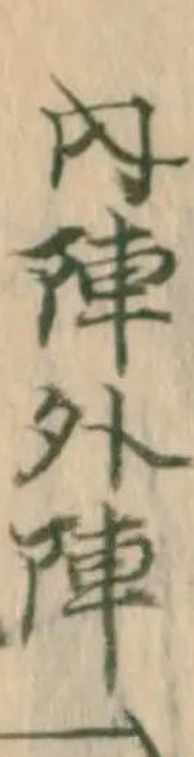内陣外陣
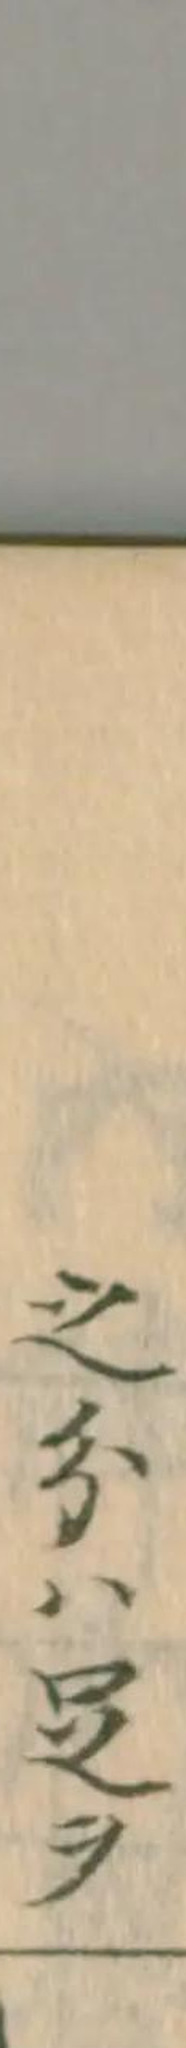之分ハ足ヲ
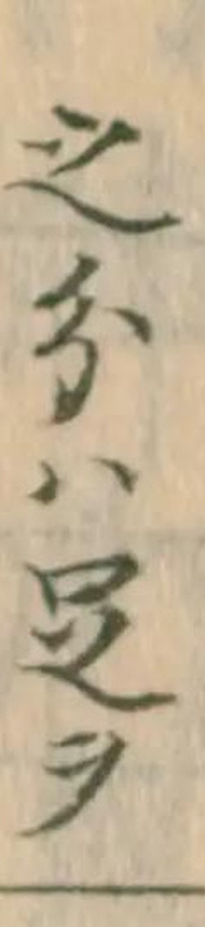之分ハ足ヲ
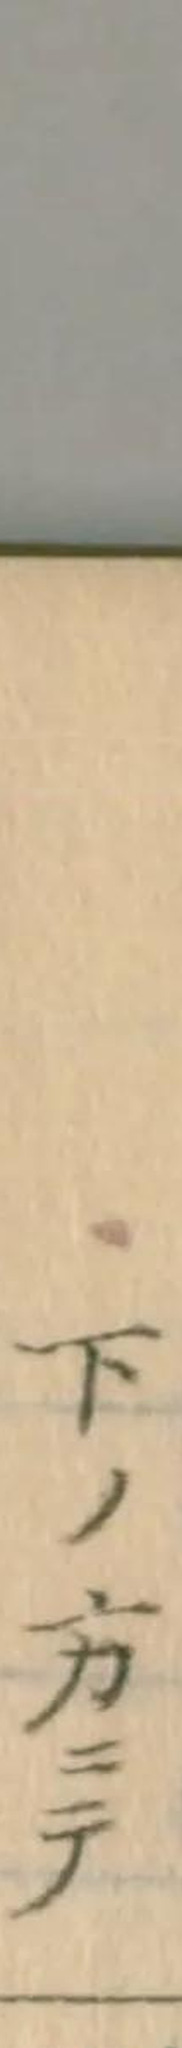下ノ方ニテ
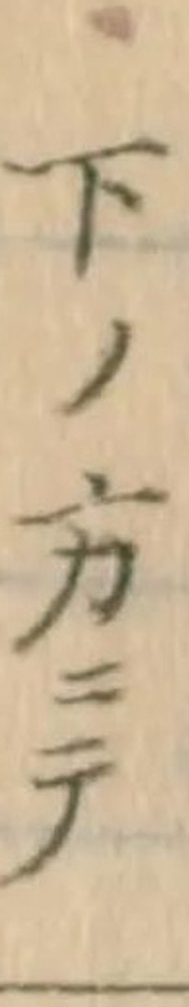下ノ方ニテ
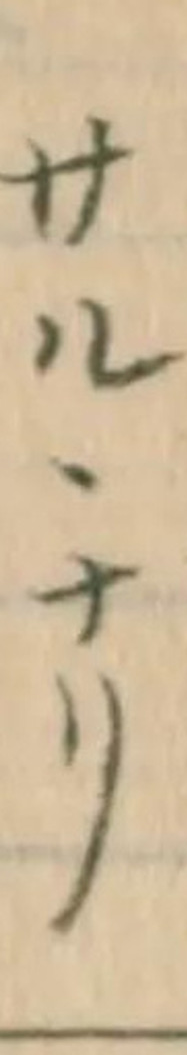サルヽナリ
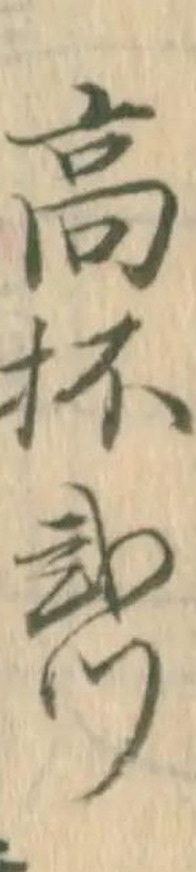高坏弐ツ
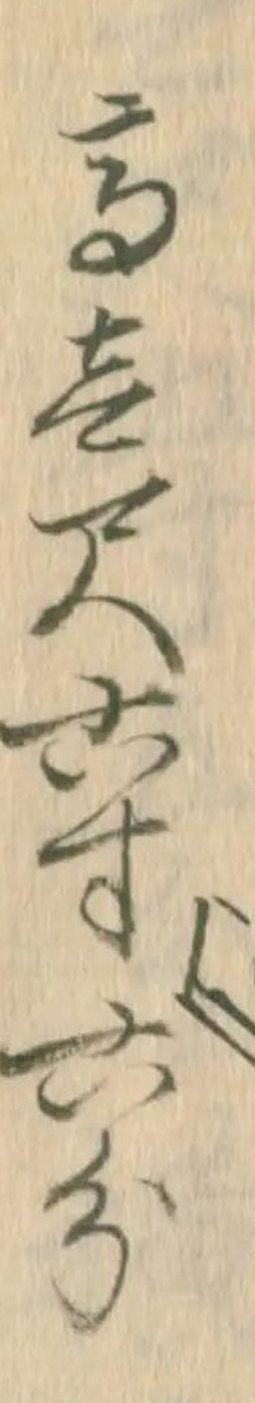高壱尺六寸六分
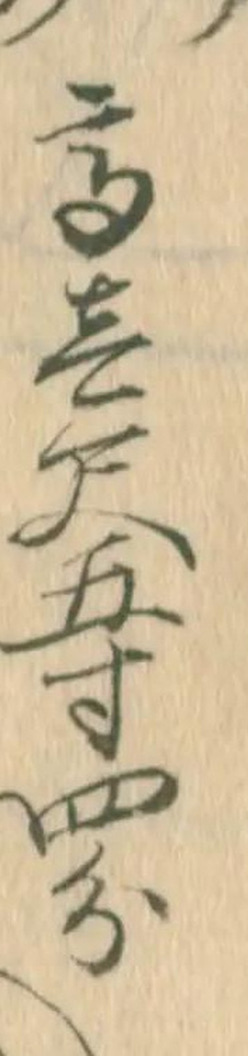高壱尺五寸四分
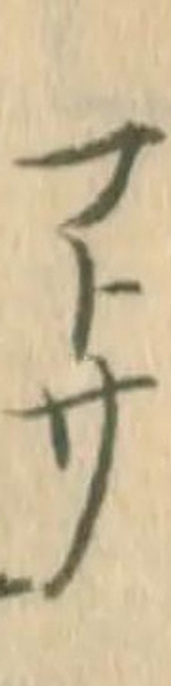フトサ
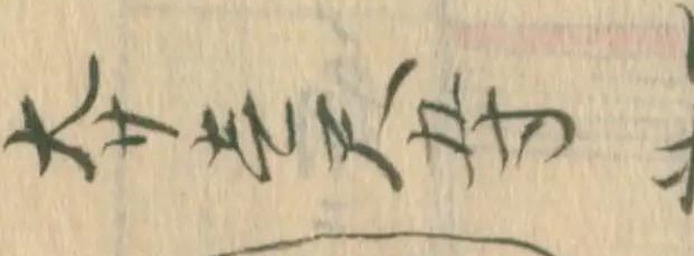大サ壱尺五寸
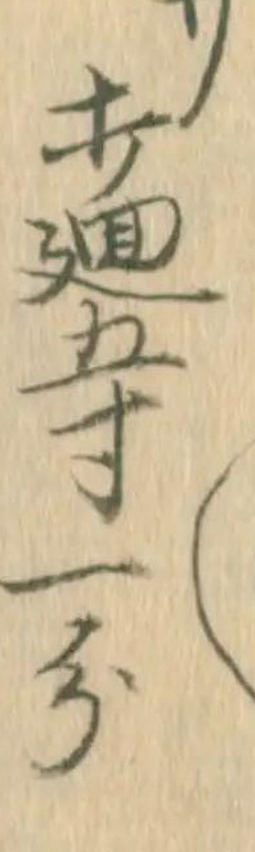打廻五寸一分

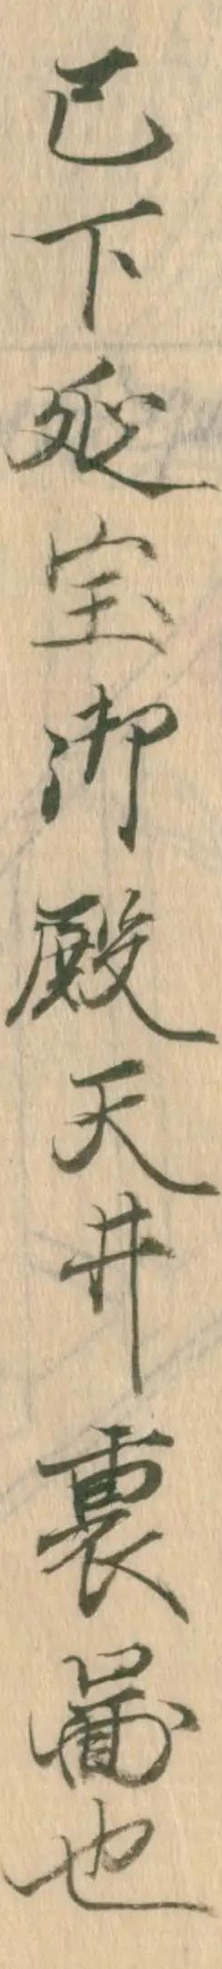已下延宝御殿天井裏図也
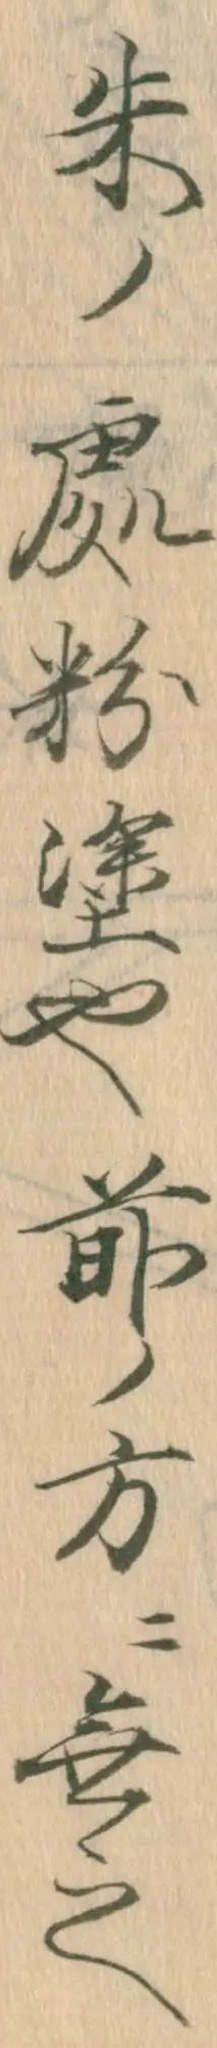後朱ノ処粉塗也前ノ方ニ無之
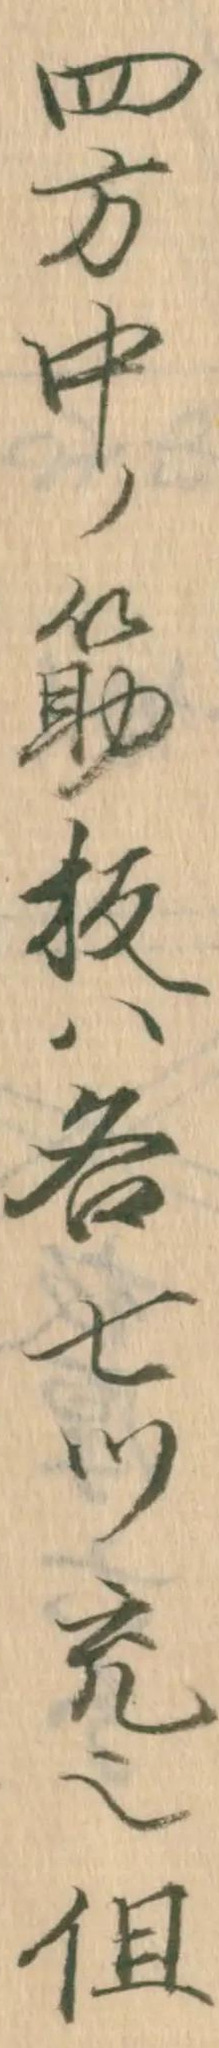北前四方中ノ筋板ハ各七ツ充也但
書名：賀茂社記録. 第15冊
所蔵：国立国会図書館 National Diet Library, JAPAN
